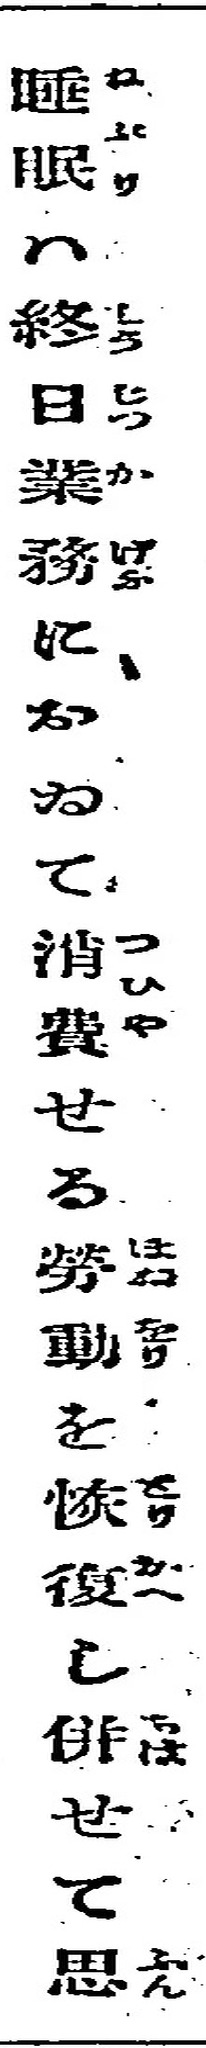睡眠は終日業務におゐて消費せる労働を恢復し併せて思
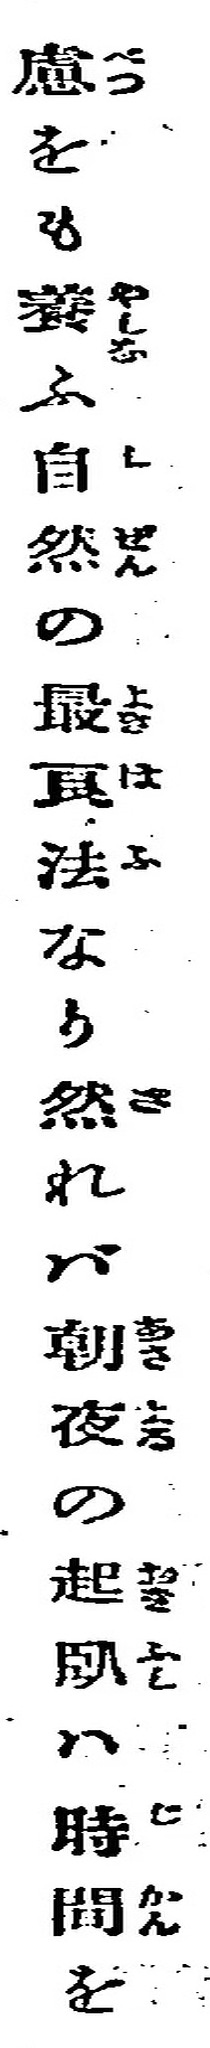慮をも養ふ自然の最良法なり然れば朝夜の起臥は時間を
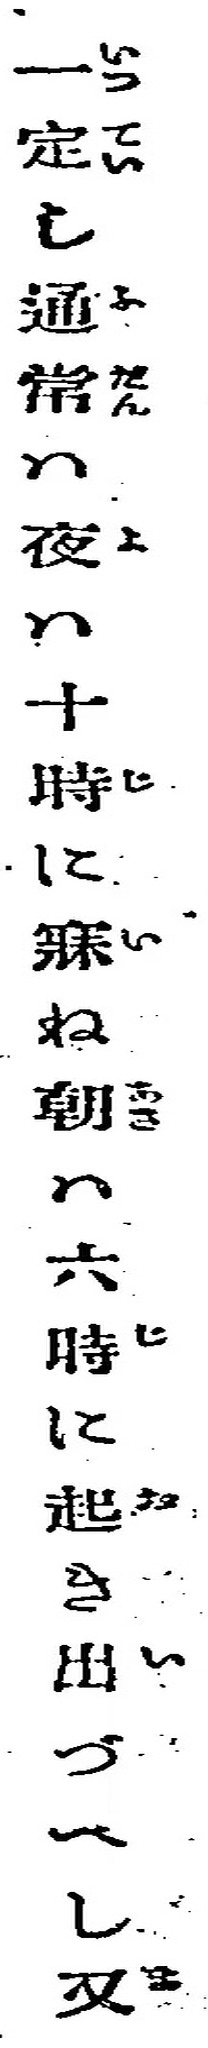一定し通常は夜は十時に寝ね朝は六時に起き出づべし又
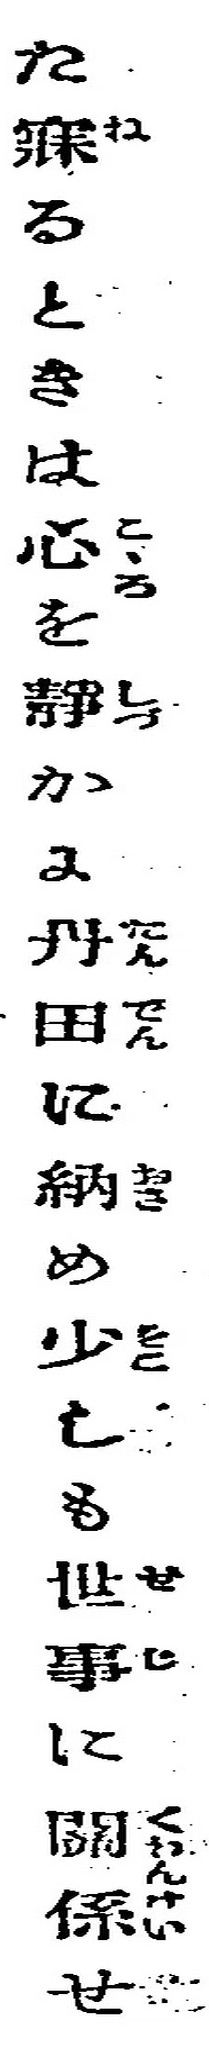た寝るときは心を静かに丹田に納め少しも世事に関係せ
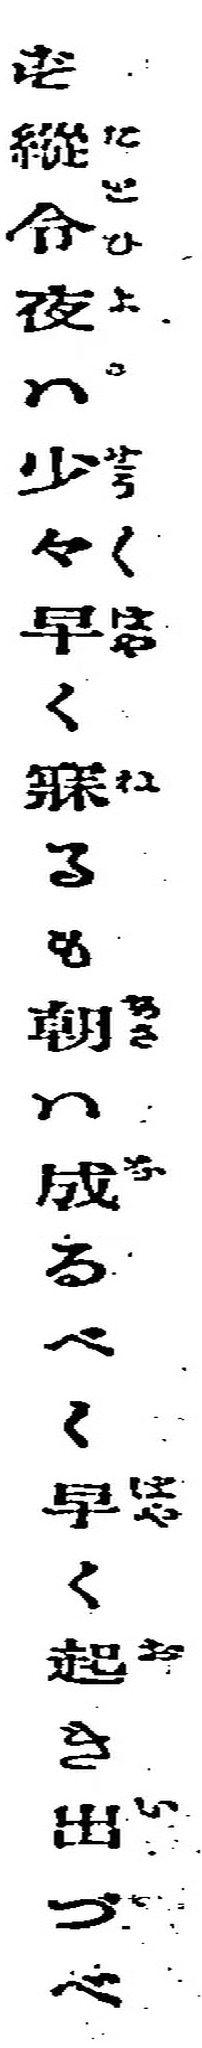ず縦令夜は少々早く寝るも朝は成るべく早く起き出づべ
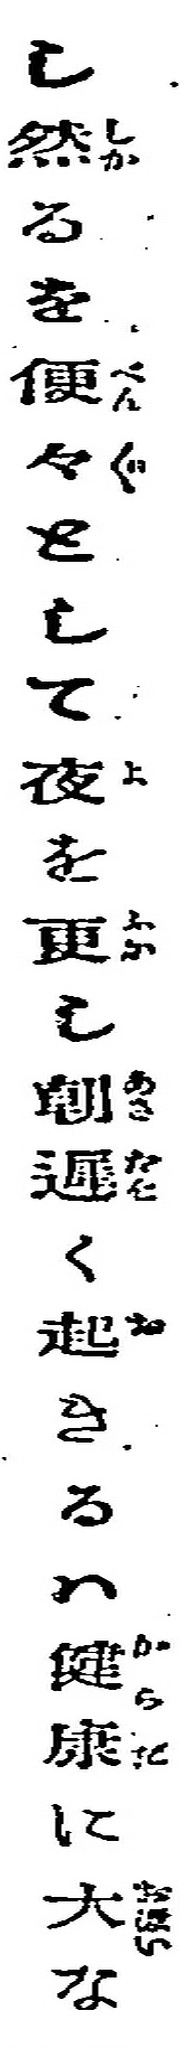し然るを便々として夜を更し朝遅く起きるは建康に大な
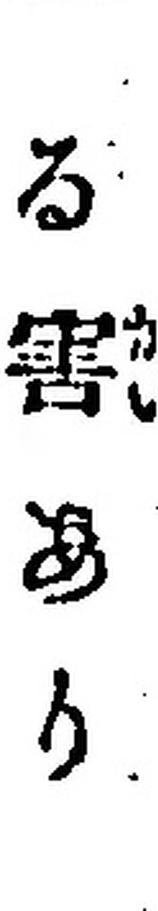る害あり
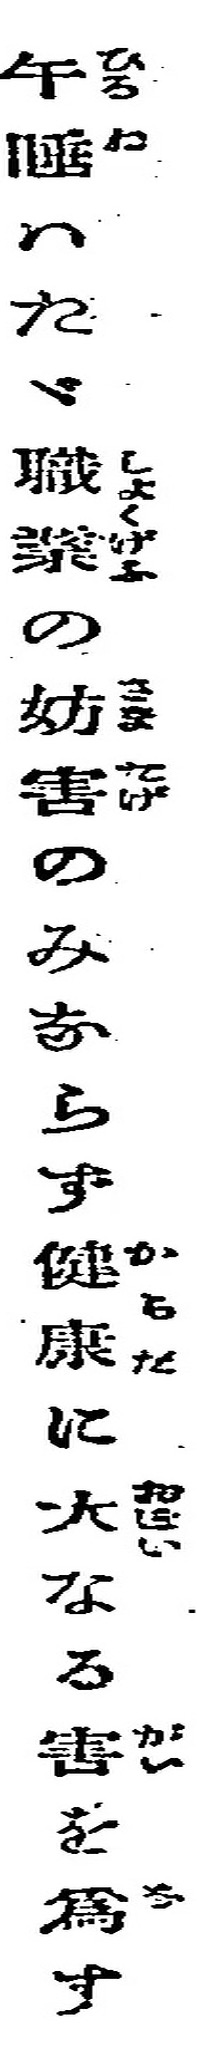午睡はたゞ職業の妨害のみならず建康に大なる害を為す
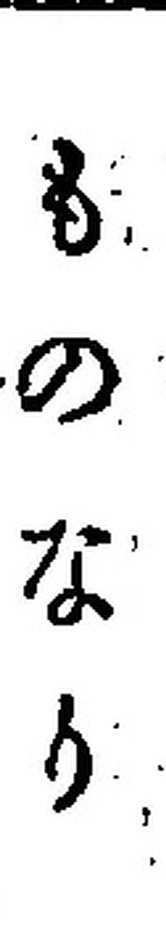ものなり

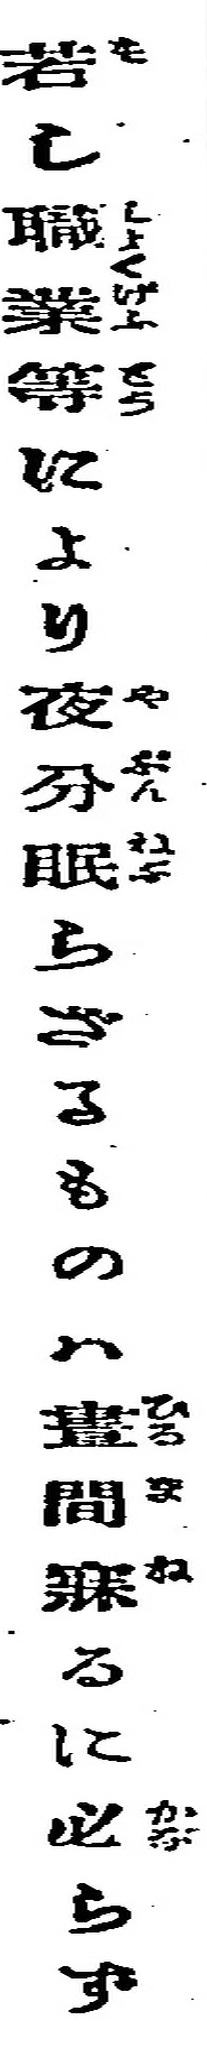若し職業等により夜分眠らざるものは晝間寝るに必らず
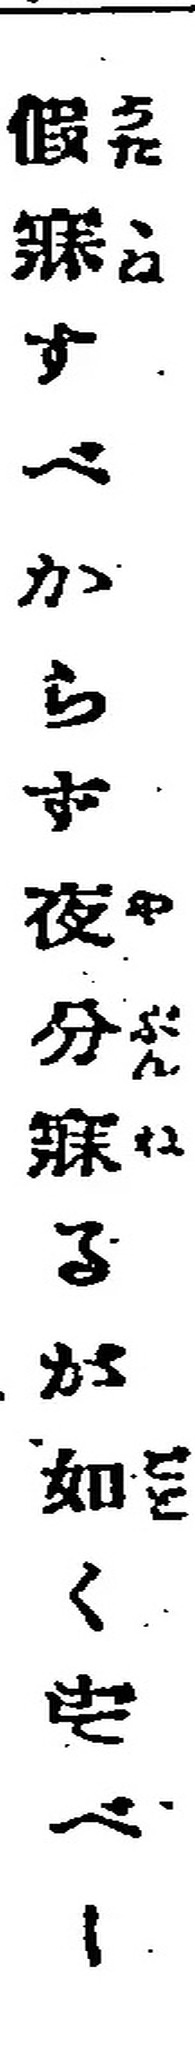假寝すべからず夜分寝るが如くすべし
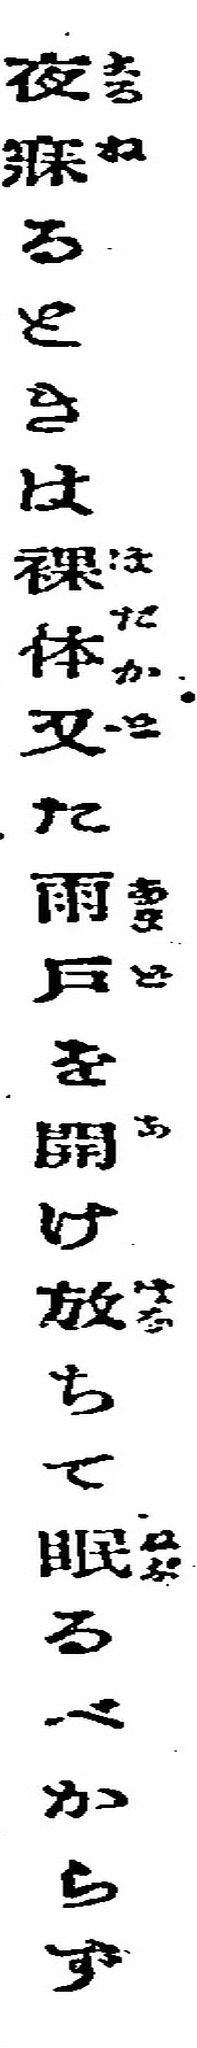夜寝るときは裸体又た雨戸を開放ちて眠るべからず
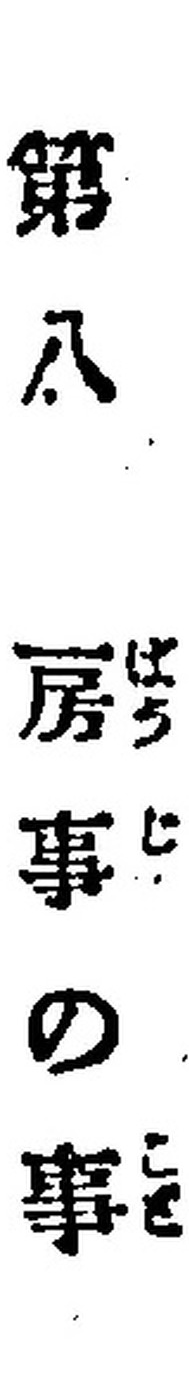第八房時の事
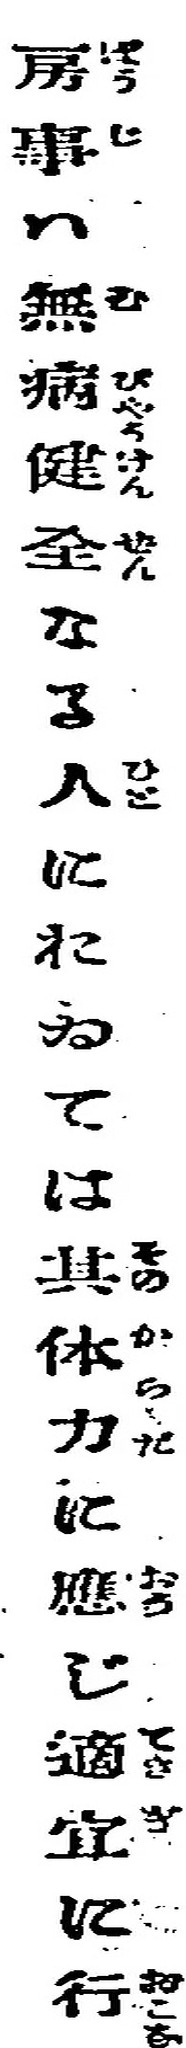房時は無病健全なる人におゐては其体力に応じ適宜に行
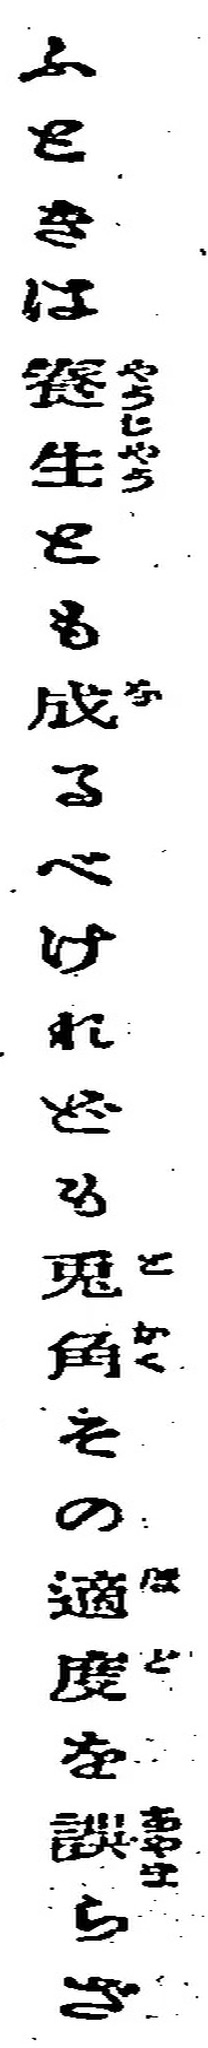ふときは養生とも成るべけれども兎角その適度を誤らざ
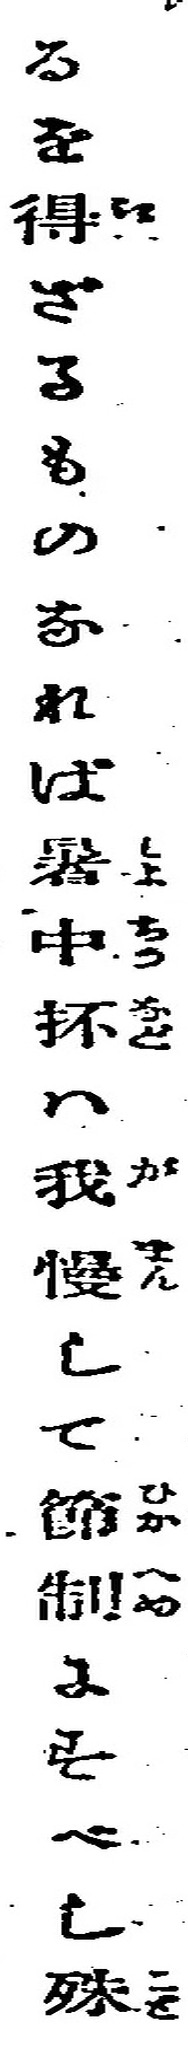るを得ざるものなれば書中抔は我慢して節制にすべし殊
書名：新撰暑中養生法 : 附・コレラ予防歌
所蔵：国立国会図書館 National Diet Library, JAPAN
